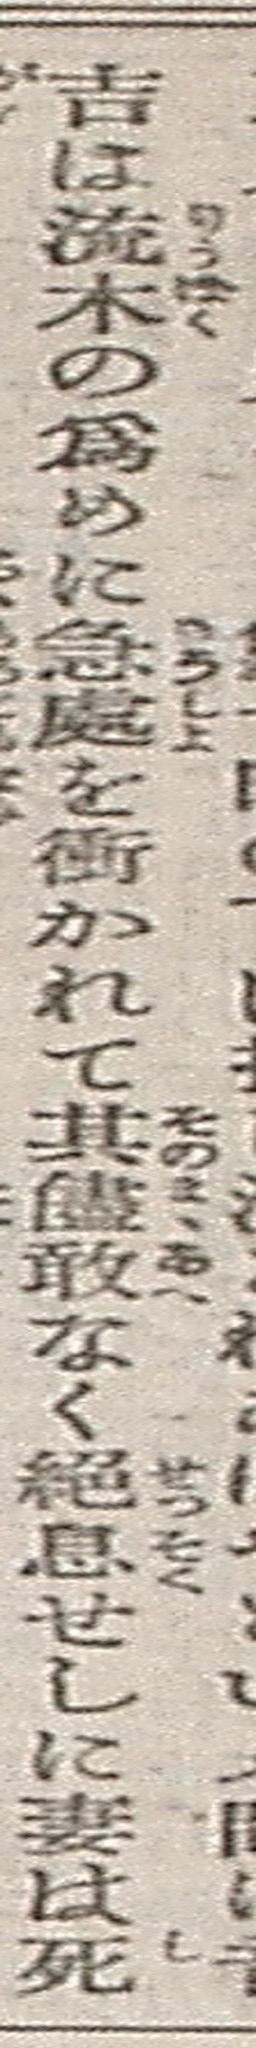吉は流木の為めに急処を衝かれて其儘敢なく絶息せしに妻は死
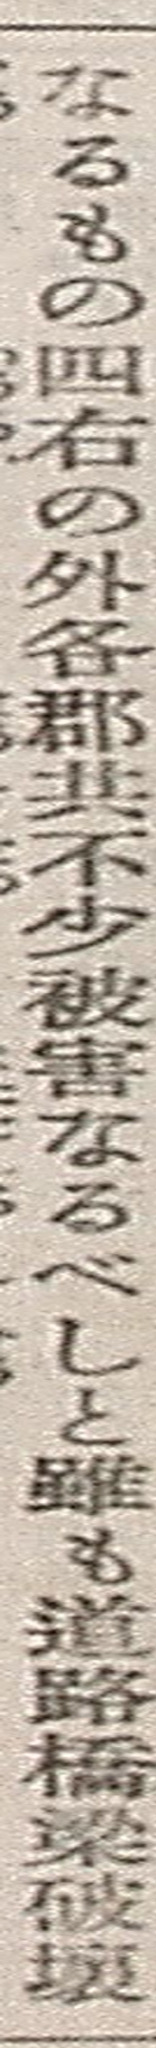なるもの四右の外各郡共不少被害なるべしと雖も道路橋梁破壊
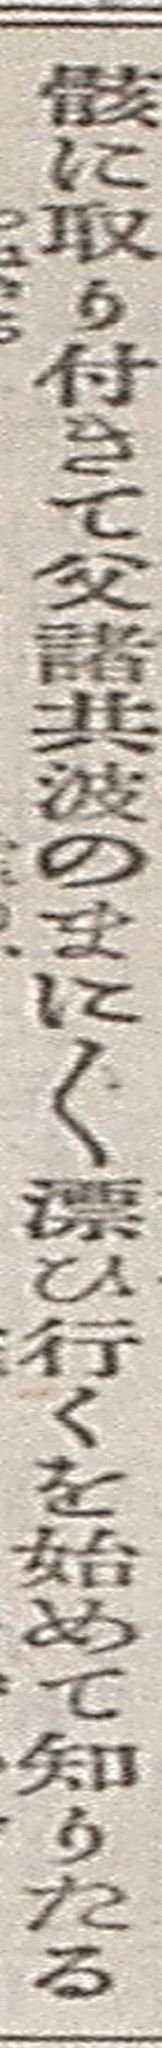骸に取り付きて父諸共波のまに〳〵漂ひ行くを始めて知りたる
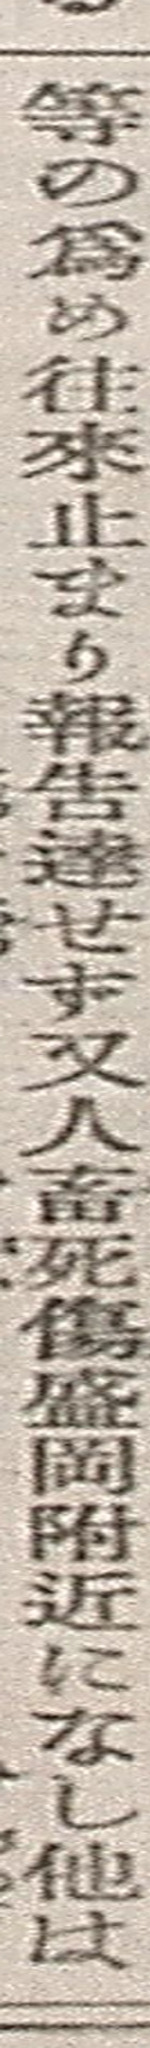等の為め往来止まり報告達せず又人畜死傷盛岡附近になし他は
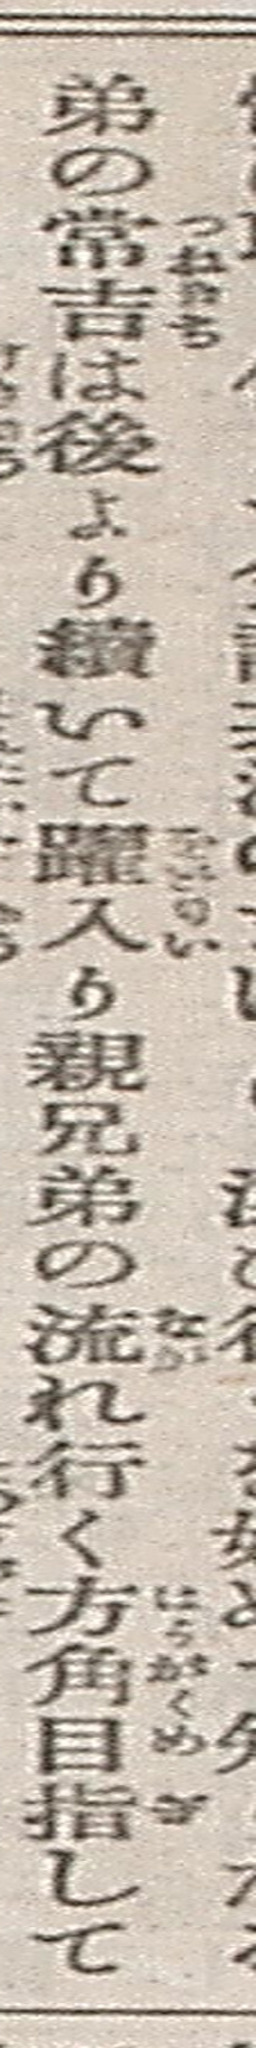弟の常吉は後より続いて躍入り親兄弟の流れ行く方角目指して
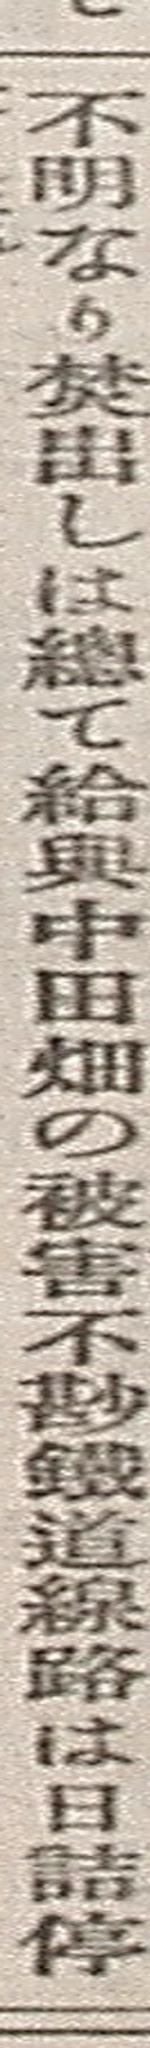不明なり焚出しは総て給与中田畑の被害不尠鉄道線路は日詰停
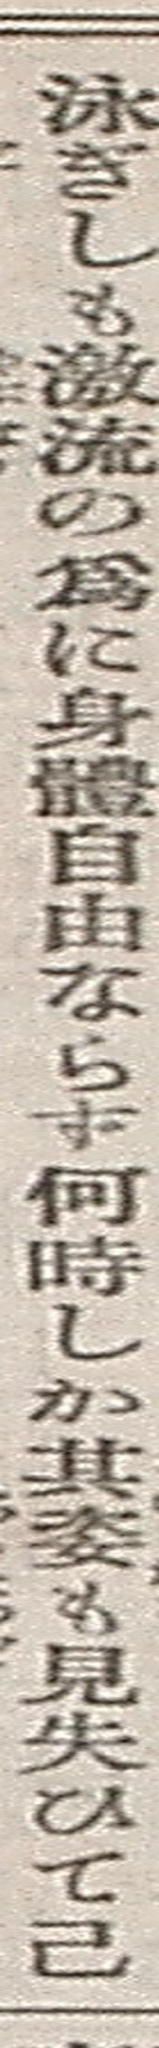泳ぎしも激流の為に身体自由ならず何時しか其姿も見失ひて己
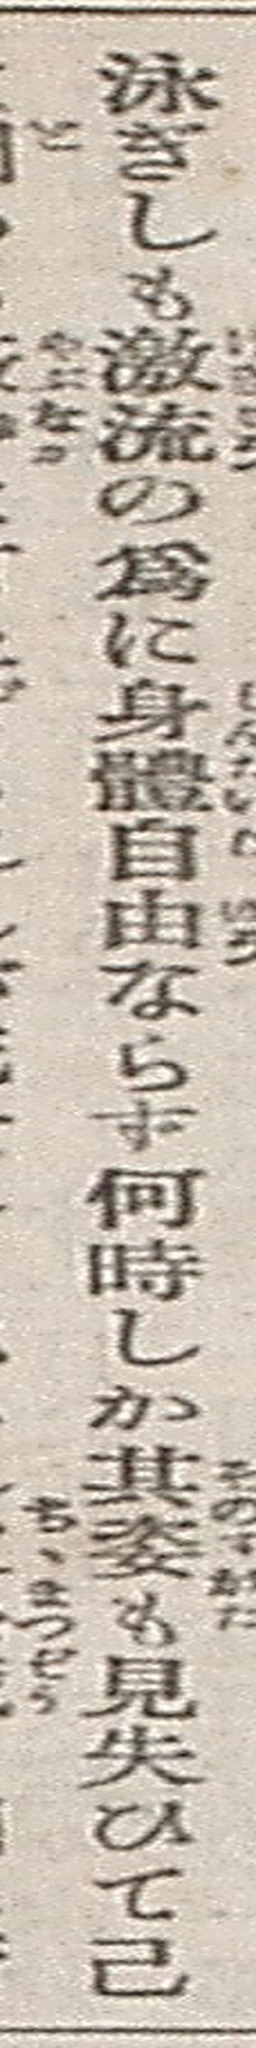泳ぎしも激流の為に身体自由ならず何時しか其姿も見失ひて己
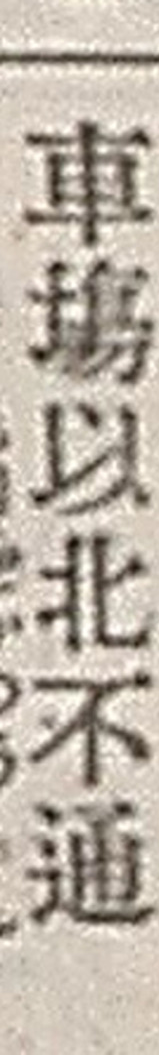車場以北不通
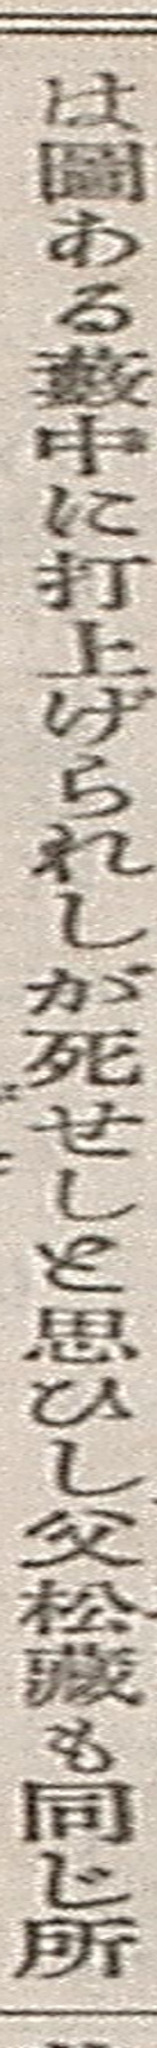は圖ある藪中に打上げられしが死せしと思ひし父松蔵も同じ所
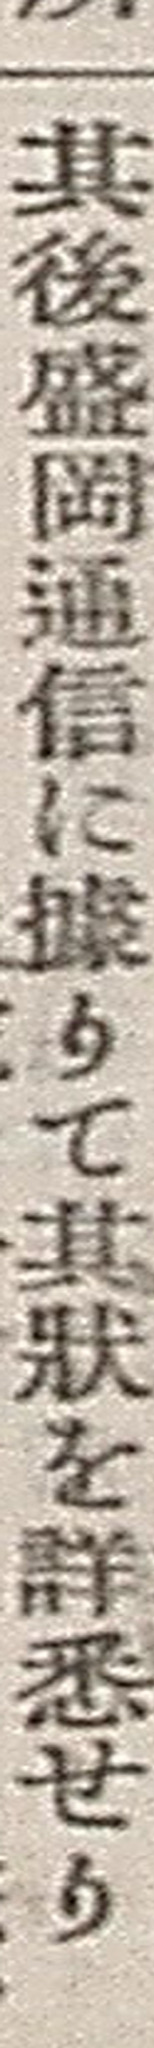其後盛岡通信に據りて其状を詳悉せり
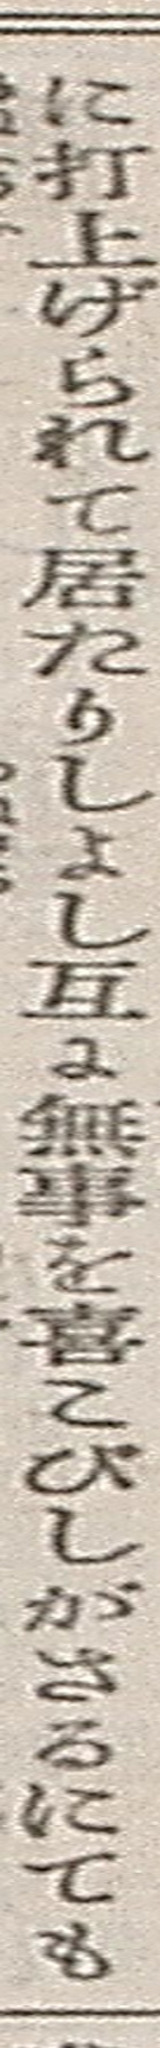に打上けられて居たりしよし互に無事を喜こびしがさるにても
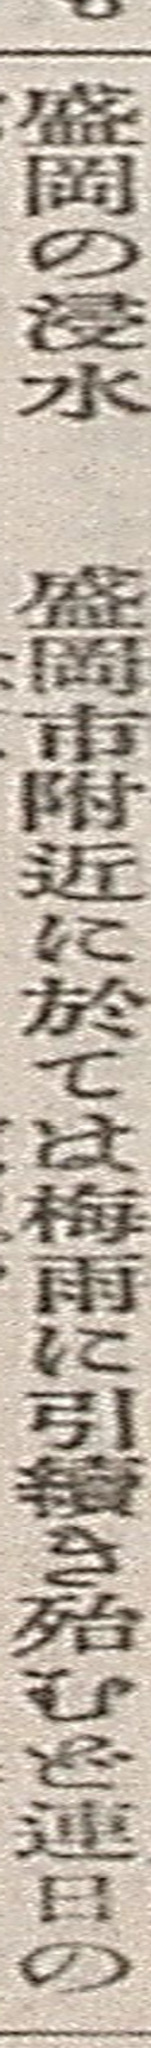盛岡の浸水盛岡市附近に於ては梅雨に引続き殆むど連日れんじつの
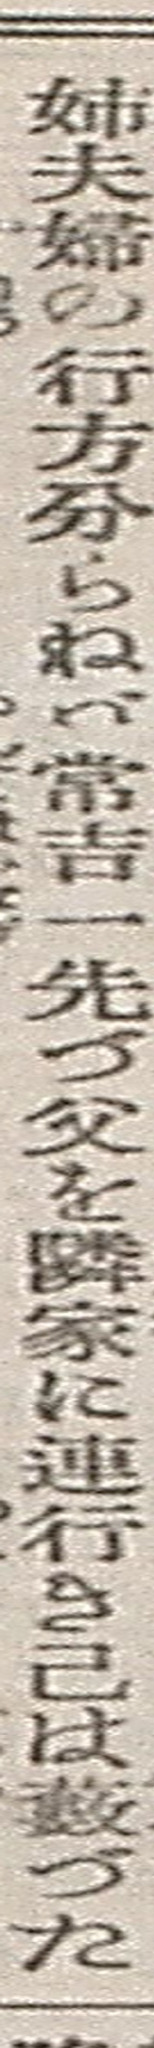姉夫婦の行方分らねば常吉一先づ父を隣家に連行き己は藪づた
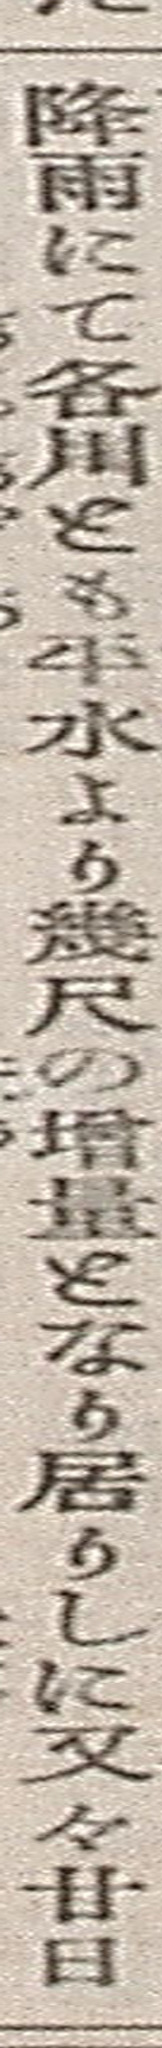降雨にて各川とも平水より幾尺の増水となり居りしに又々廿日
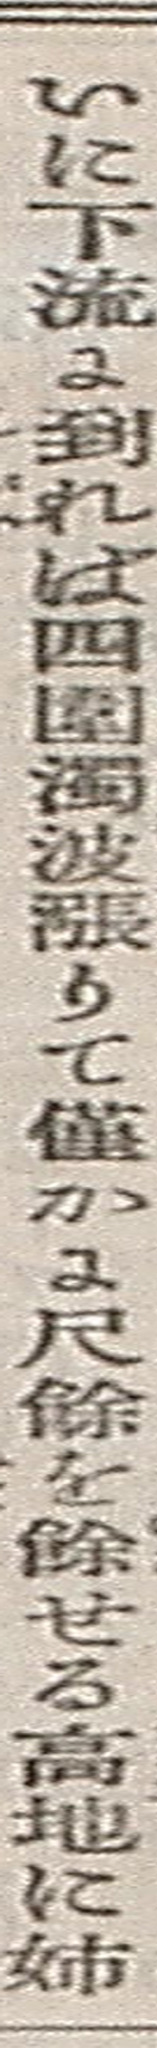いに下流に到れば四圍濁波漲りて僅かに尺餘を餘せる高地に姉
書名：風俗畫報臨時増刊第百二十八號　洪水被害録（下）
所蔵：東京大学地震研究所図書室 Earthquake Research Institute Library, The University of Tokyo, JAPAN
